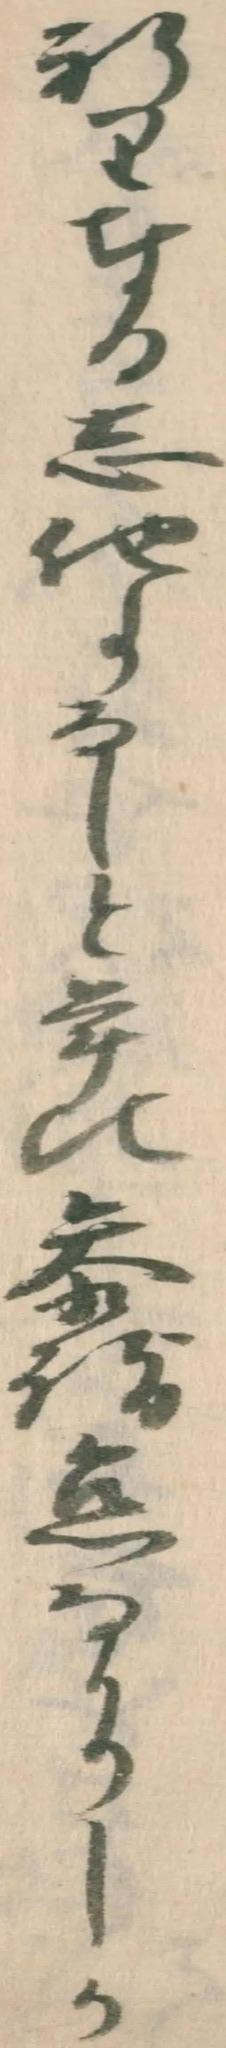祈り奉る志他事なしと年比参詣怠なかりしか
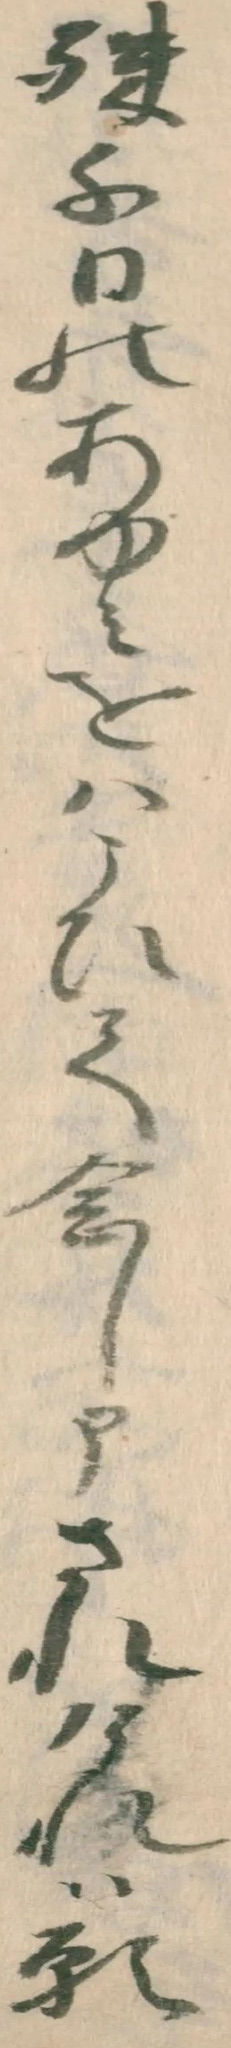殊千日のあゆみをはこひて念し申されけれは願
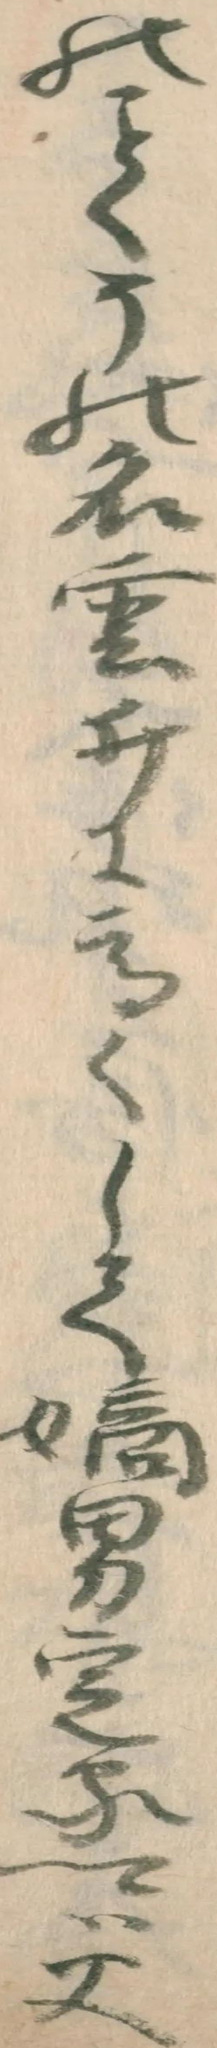のことくその名雲井に高くして嫡男定家卿は父
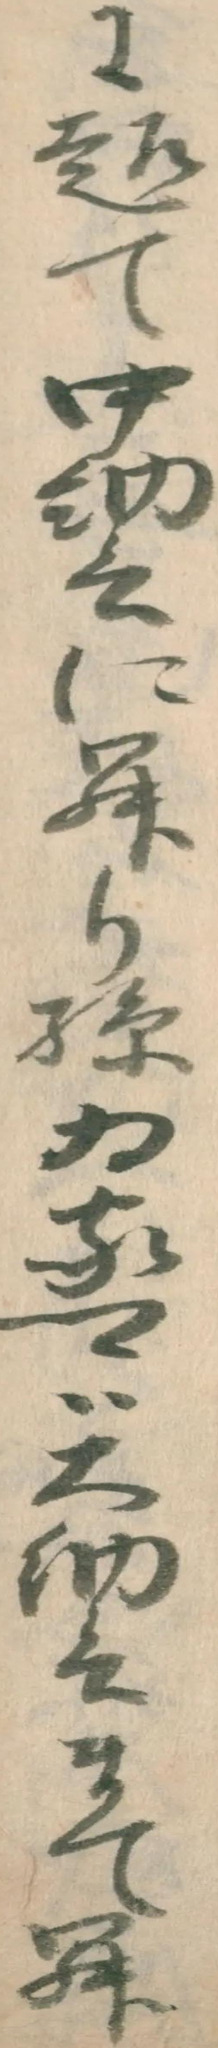に超て中納言に昇り孫為家卿は大納言まて昇

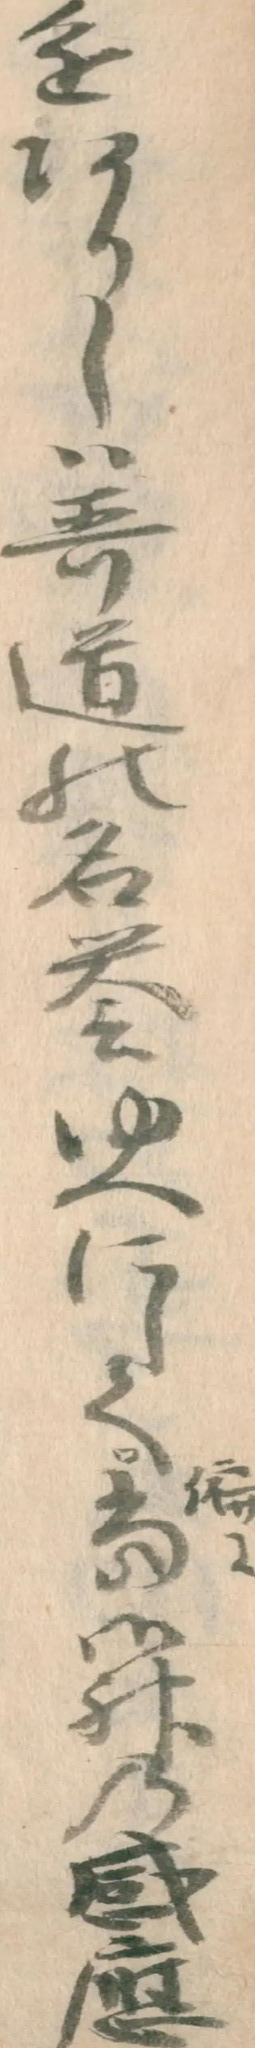進ありしは哥道の名誉ゆへにして◦当御神の感応
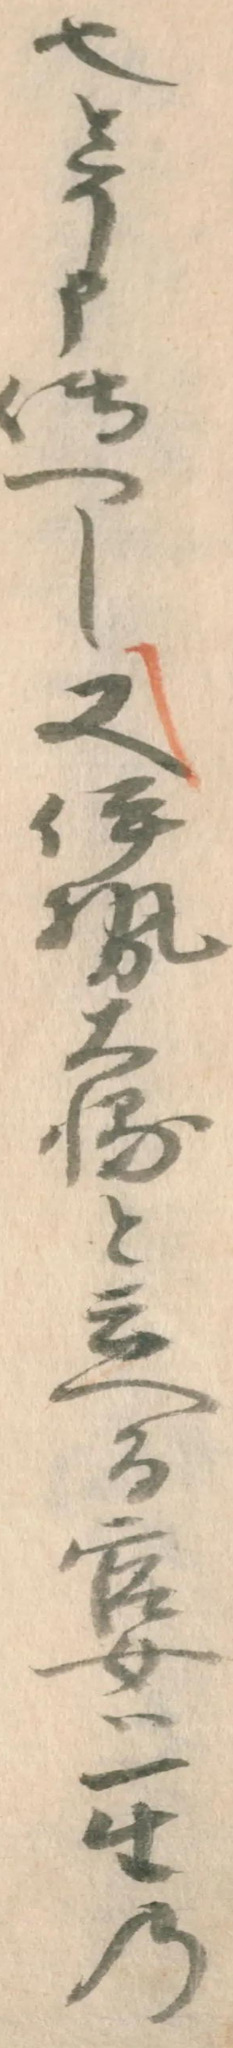也とそ申伝へし又伊勢大輔と云へる官女は一生の
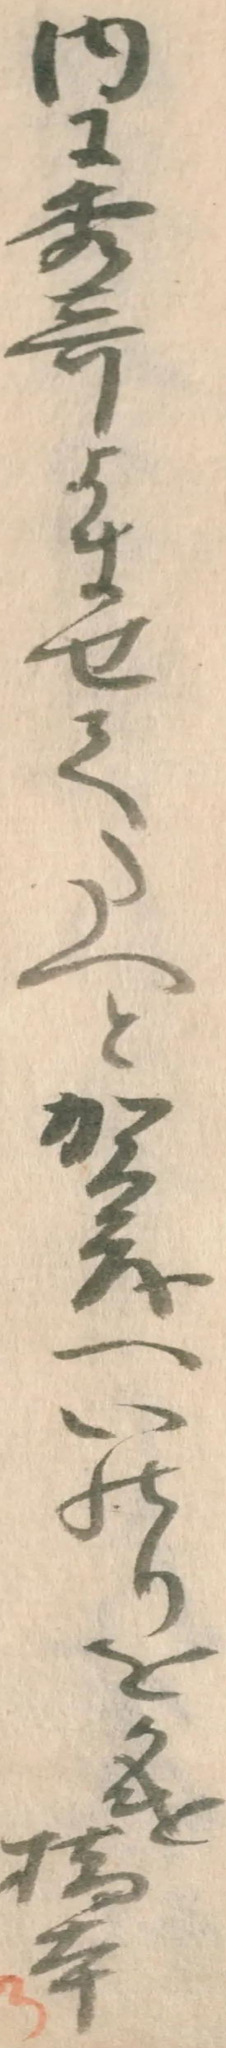内に秀哥よませてたへと賀茂へいのりをかけ橋本の
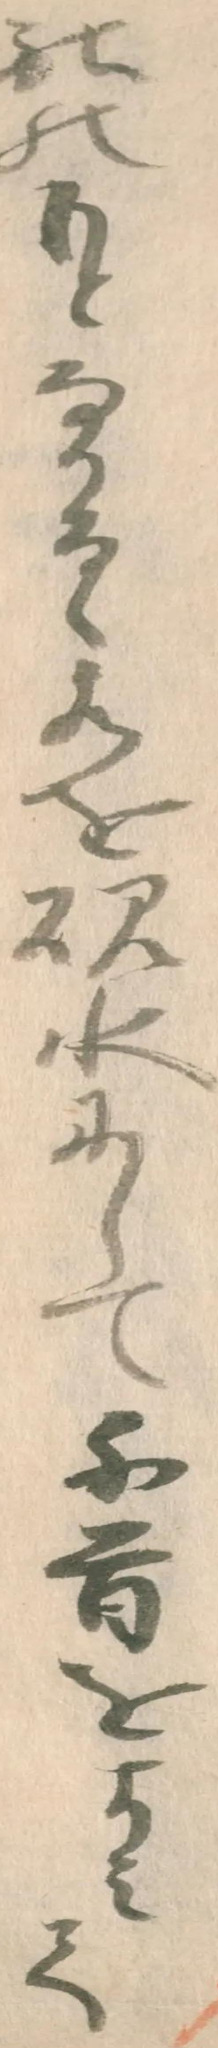社のもとなかるゝ水を硯水にして千首をよみて
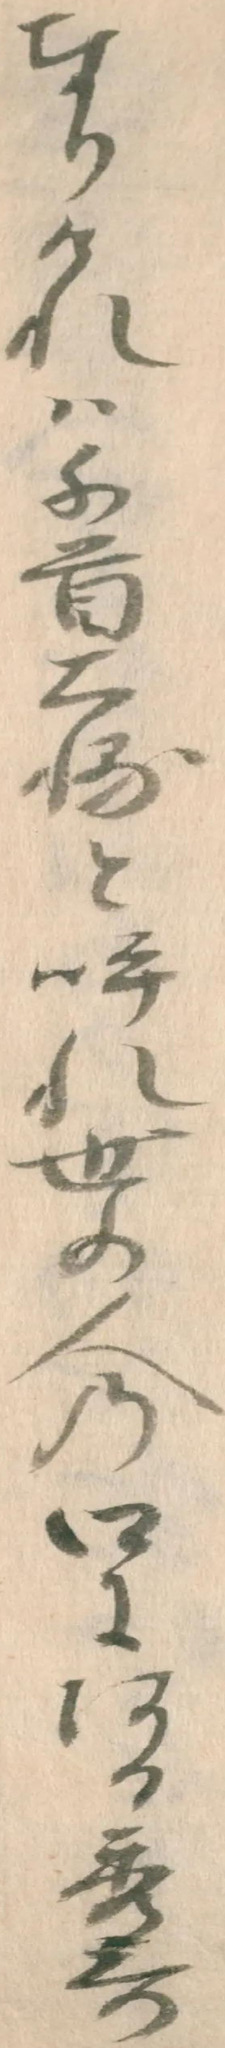奉りけれは千首大輔と呼れ世の人の口にある秀哥
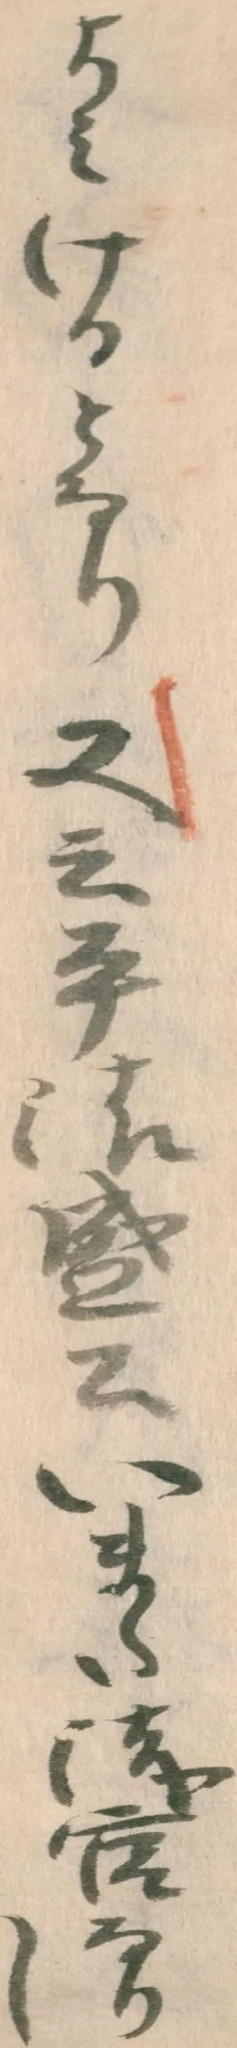よみけるとなり又云平清盛公いまた浅官なりし
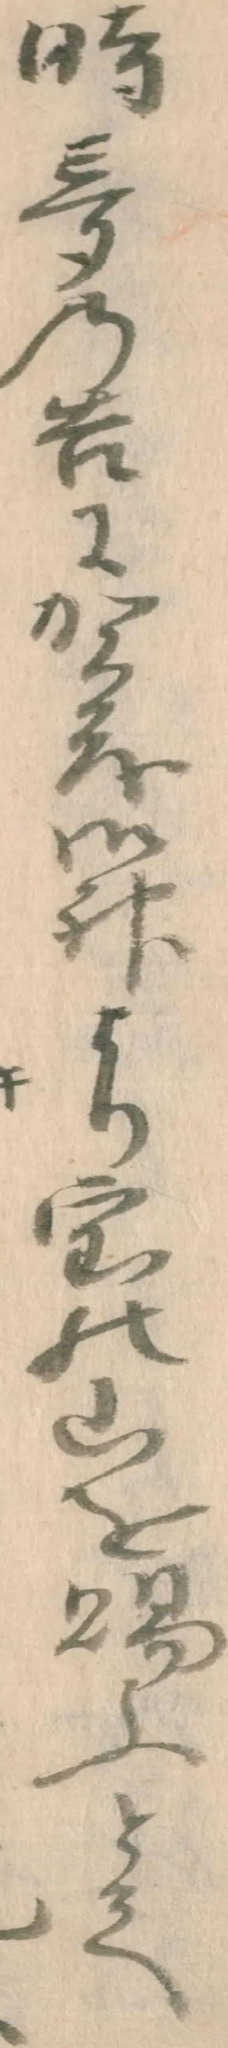時夢の告に賀茂御神より宝の山を賜ふとて
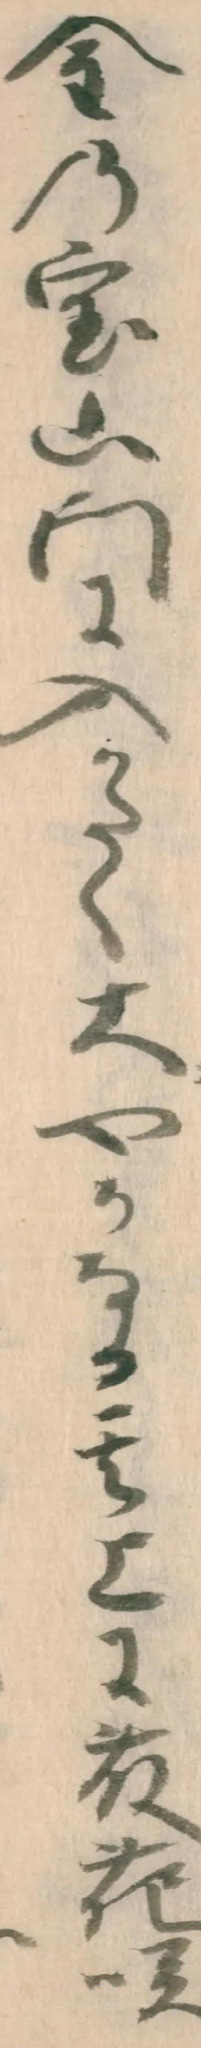金の宝山門に入かたく大其上に藤花咲
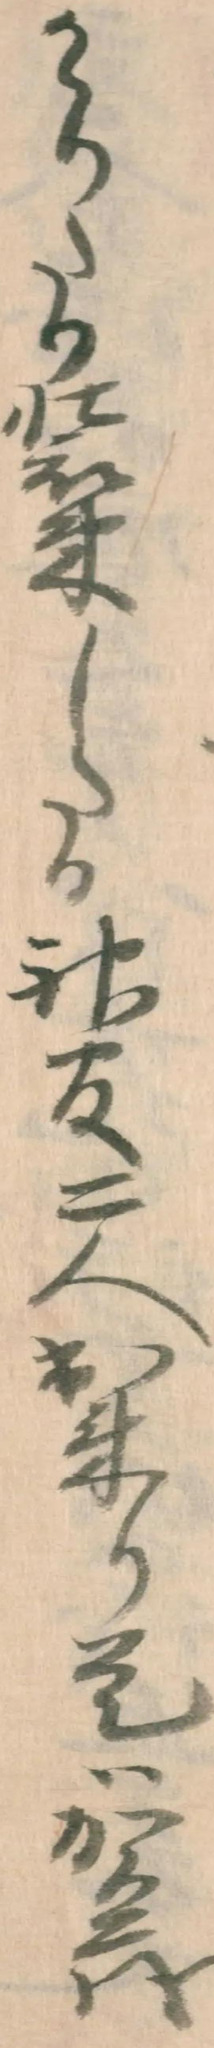かゝりたる装束したる神官二人出来り是は賀茂
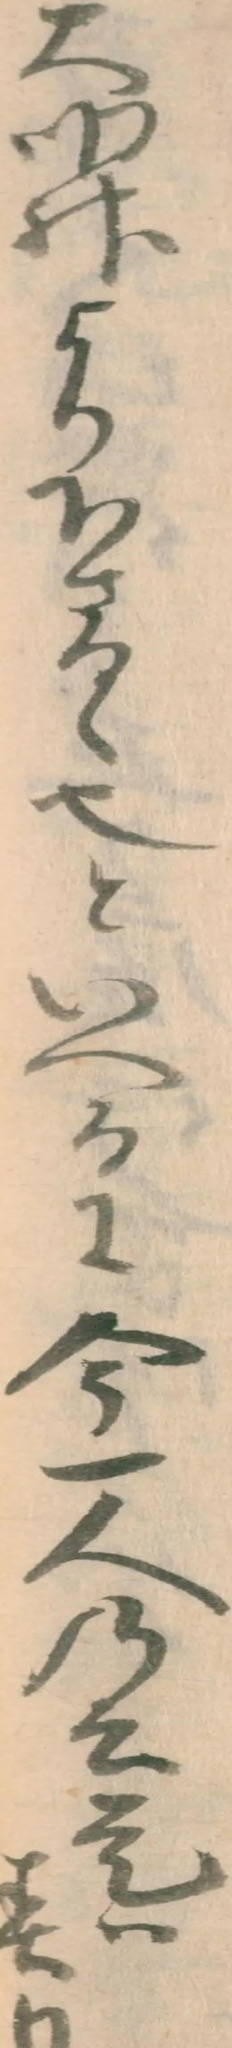大明神より下さるゝ也といへるに今一人の云是は春日
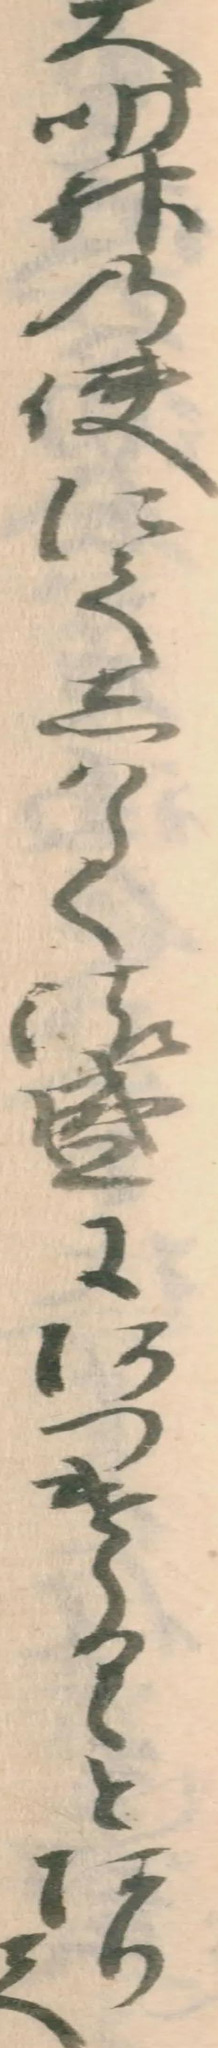大明神の使にてしはらく清盛にあつけらるゝとありて
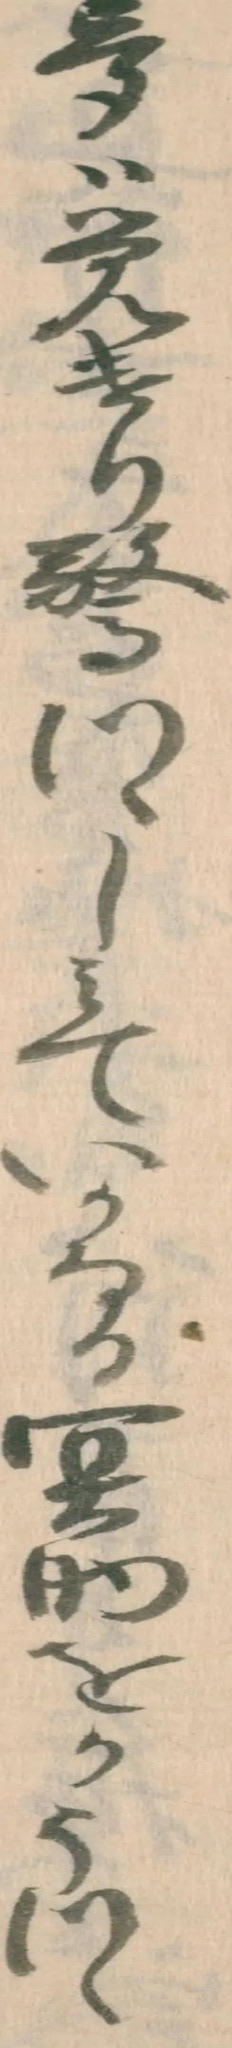夢は覚けり驚つゝしみていかなる冥助をかうつゝに
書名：賀茂社記録. 第1冊
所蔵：国立国会図書館 National Diet Library, JAPAN
